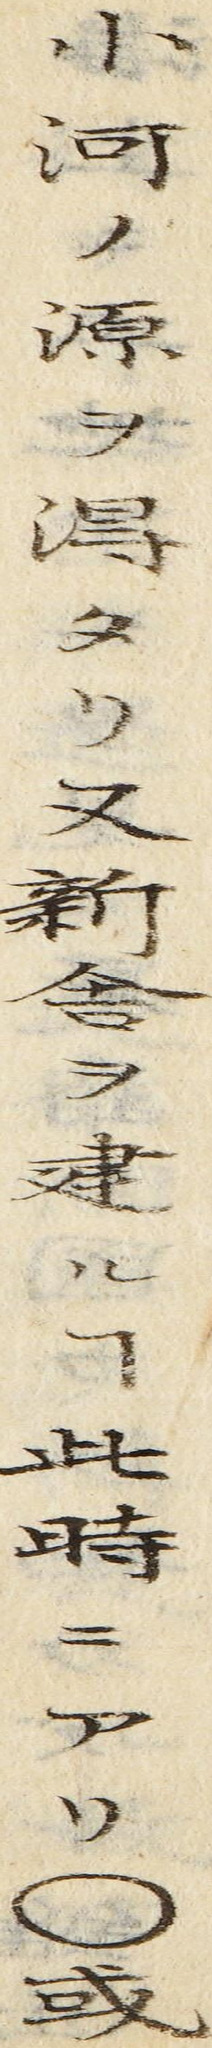小河ノ源ヲ得タリ又新舎ヲ建ルコト此時ニアリ◯或
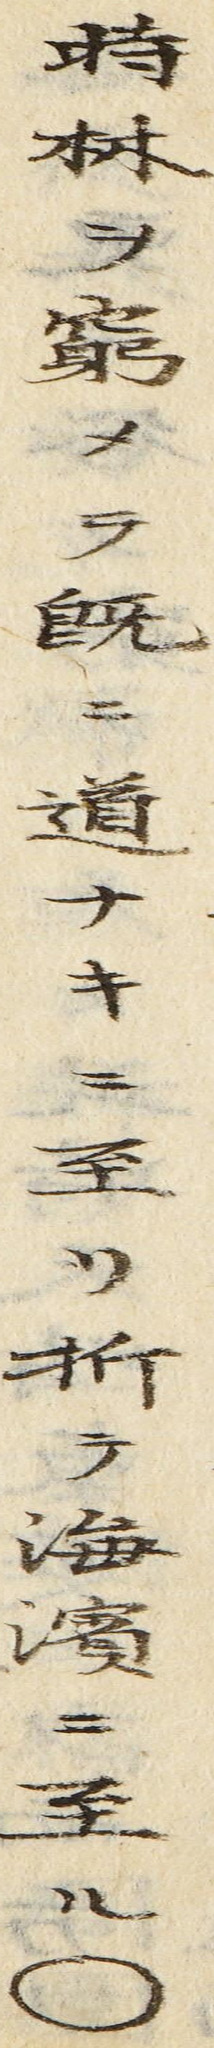時林ヲ窮メテ既ニ道ナキニ至リ折テ海浜ニ至ル◯
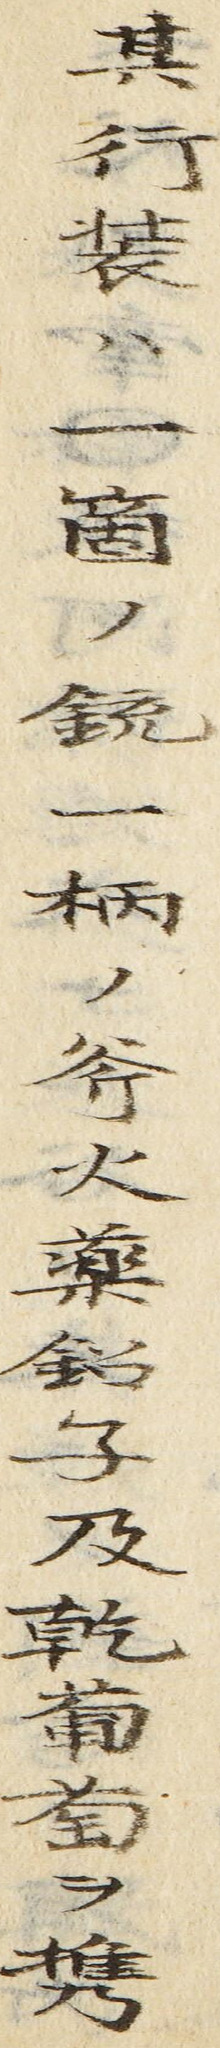其行装ハ一箇ノ銃一柄ノ斧火薬鉛子及乾葡萄ヲ携

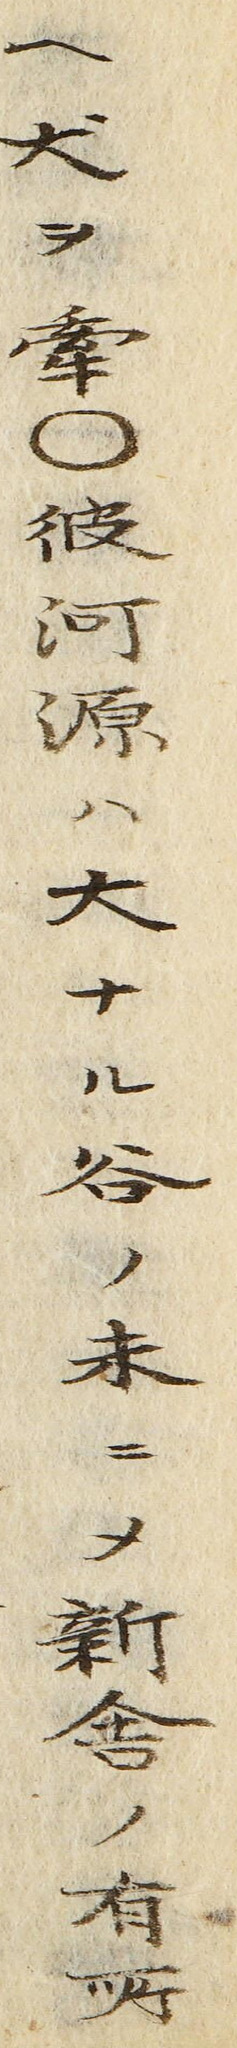ヘ犬ヲ牽◯彼河源ハ大ナル谷ノ未ニシテ新舎ノ有所
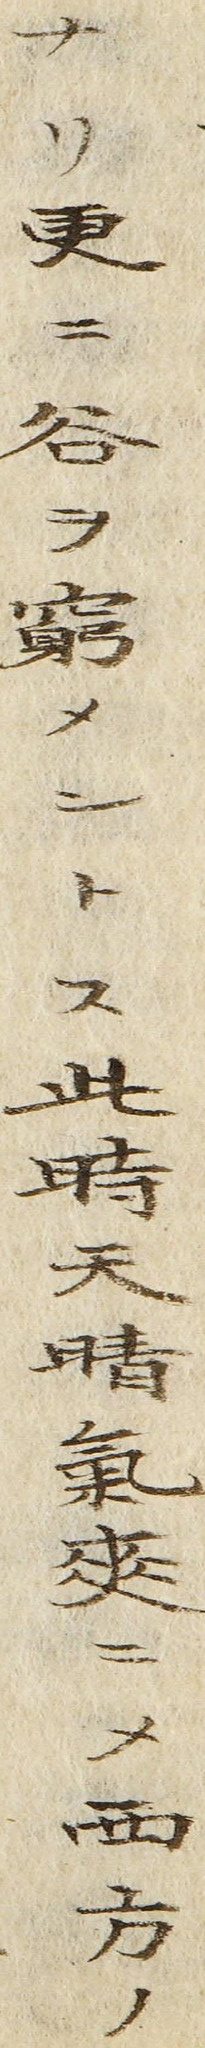ナリ更ニ谷ヲ窮メントス此時天晴気爽ニシテ西方ノ
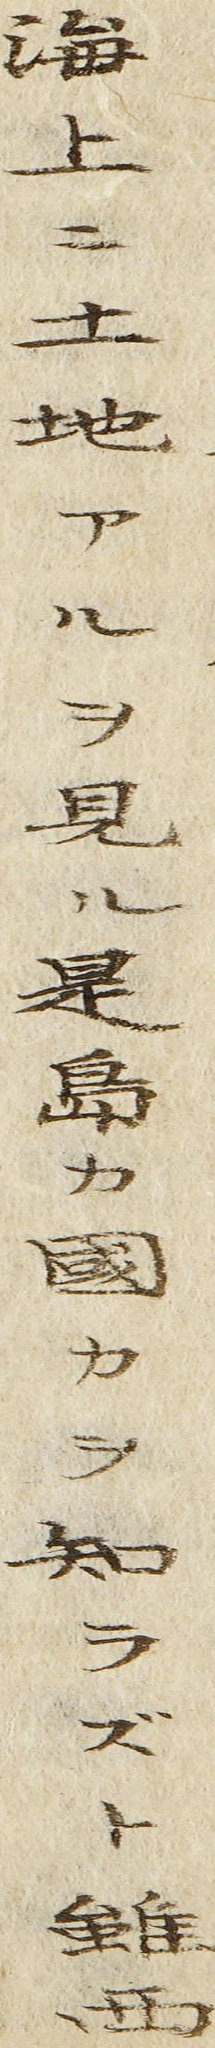海上ニ土地アルヲ見ル是島カ国カヲ知ラズト雖西
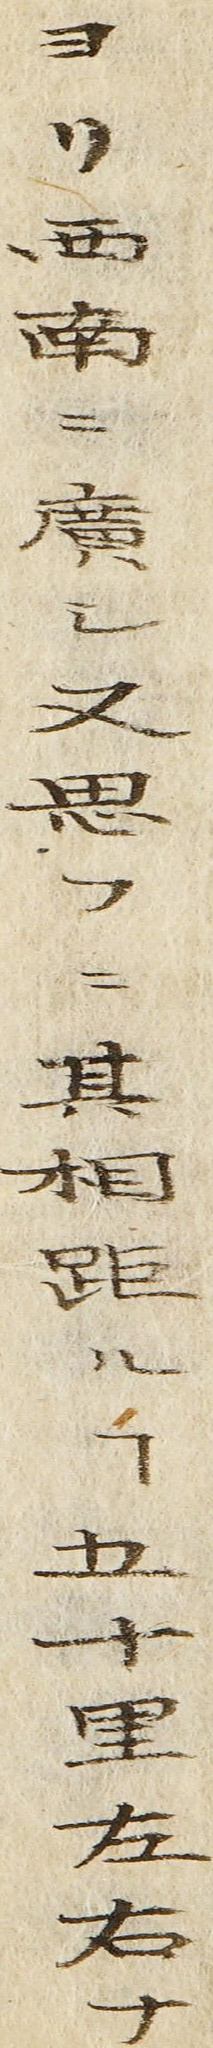ヨリ西南ニ広シ又思フニ其相距ルコト五十里左右ナ
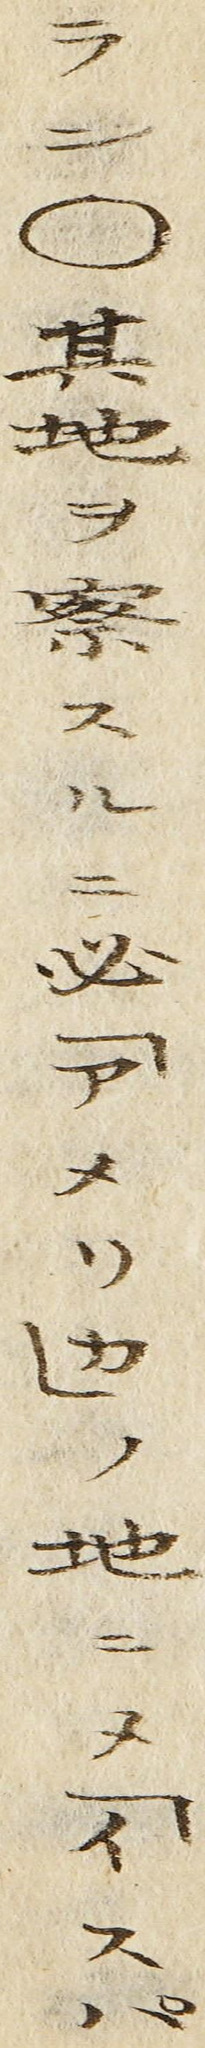ラン◯其地ヲ察スルニ必「アメリカ」ノ地ニシテ「イスパ
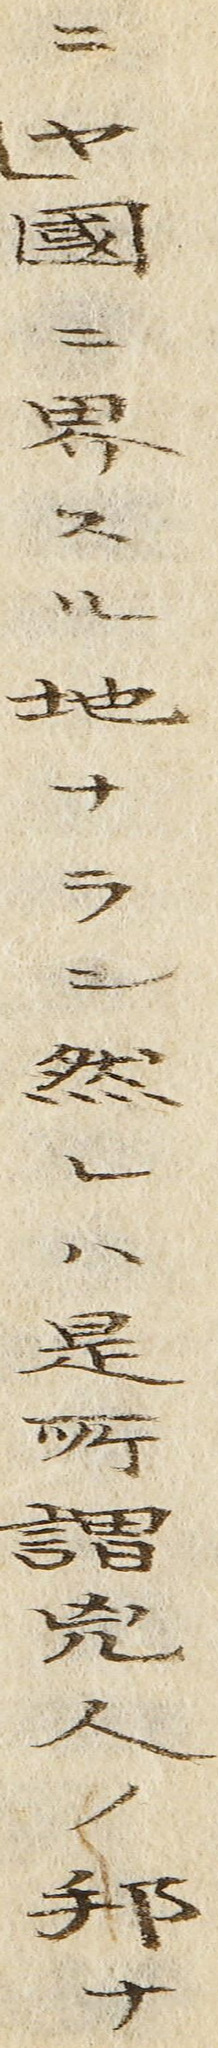ニヤ」国ニ界スル地ナラン然レハ此所謂兇ノ邦ナ
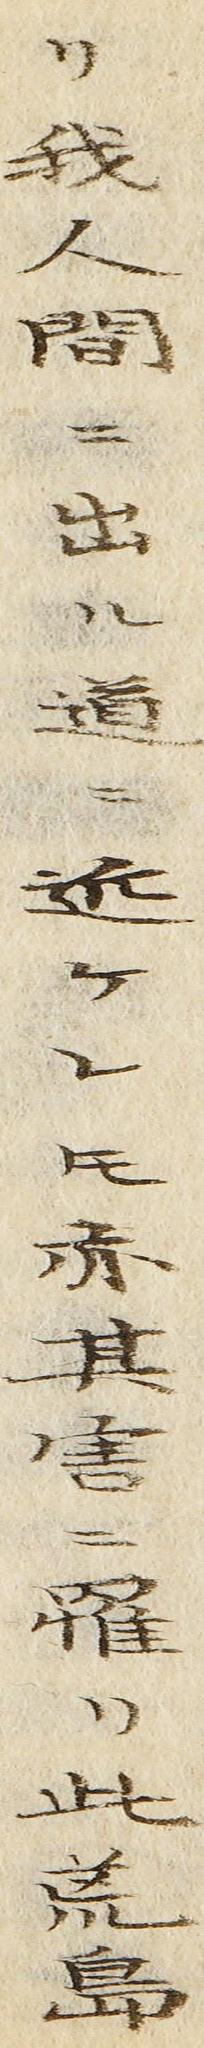リ我人間ニ出ル道ニ近ケレトモ亦其害ニ罹リ此荒島
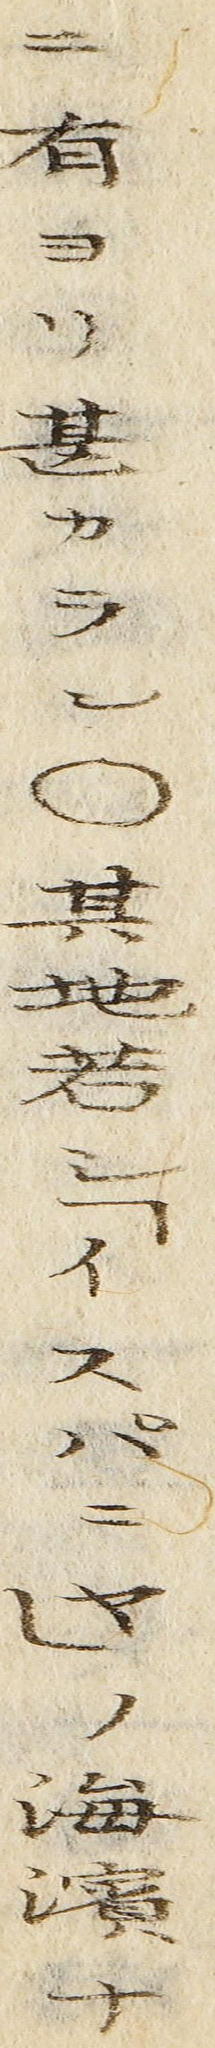ニ有ヨリ甚カラン◯其地若シ「イスパニヤ」ノ海浜ナ
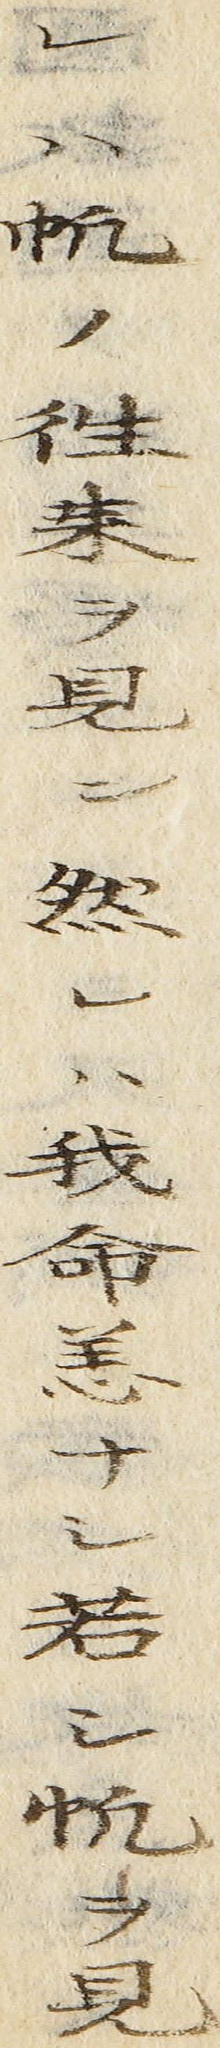レハ帆ノ往来ヲ見ン然レハ我命恙ナシ若シ帆ヲ見
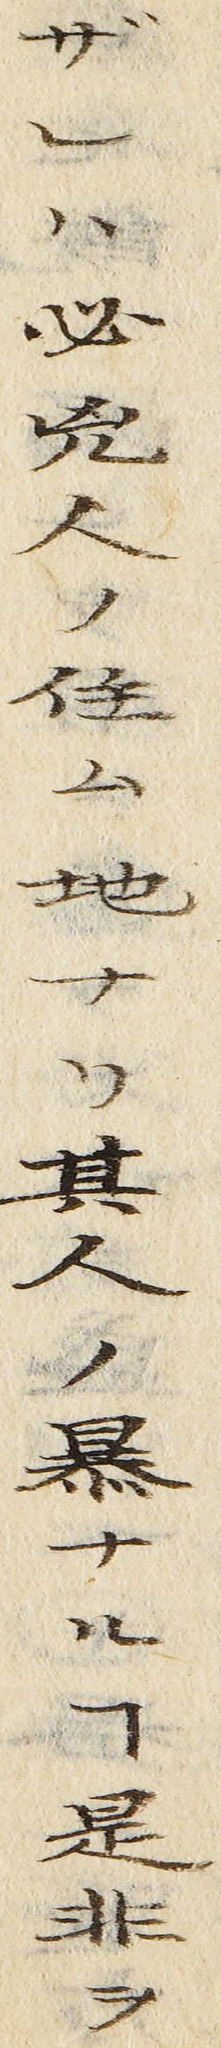ザレハ必兇人ノ住ム地ナリ其人ノ暴ナルコト是非ヲ
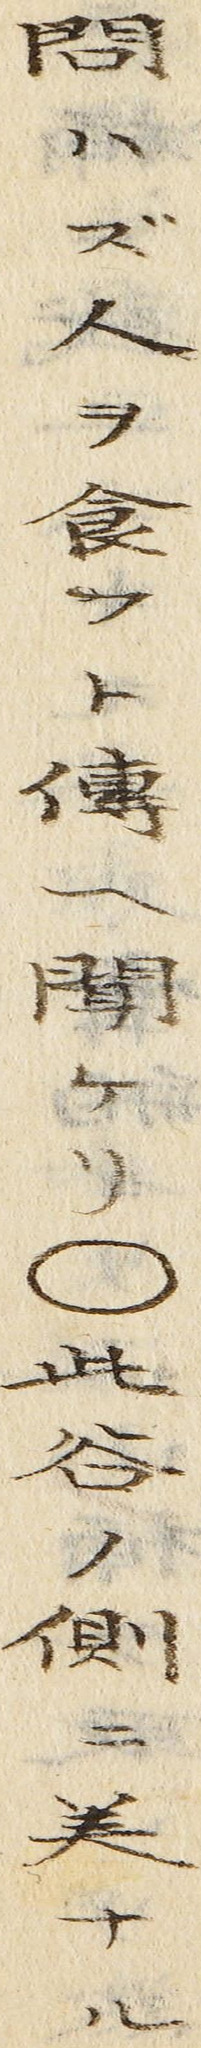問ハズ人ヲ食フト伝ヘ聞ケリ◯此谷ノ側ニ美ナル
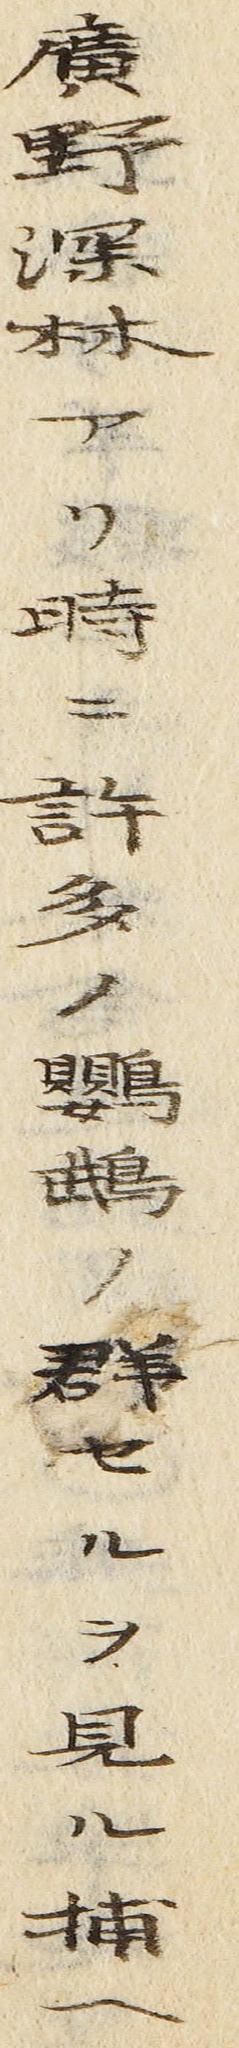広野深林アリ時ニ許多ノ鸚鵡ノ群セルヲ見ル捕ヘ
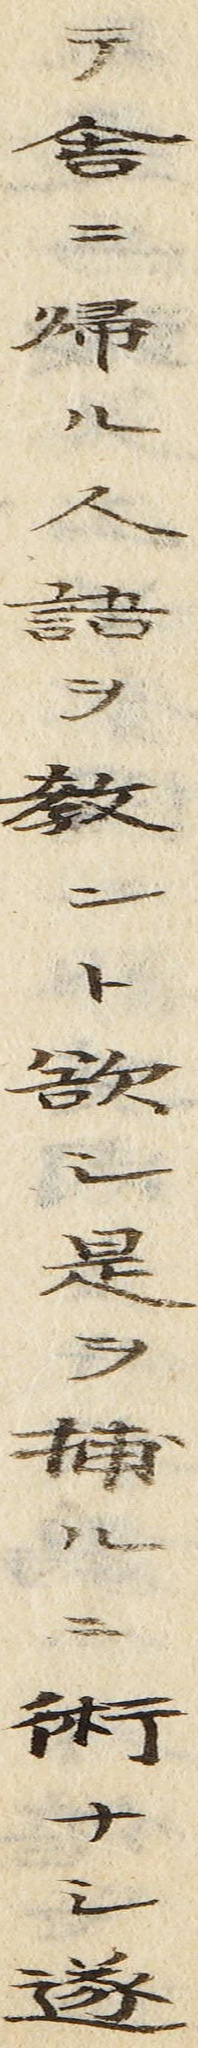テ舎ニ帰ル人語ヲ教ント欲シ是ヲ捕ルニ術ナシ遂
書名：漂流紀事
